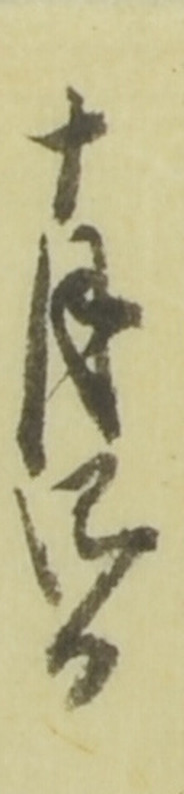十月四日
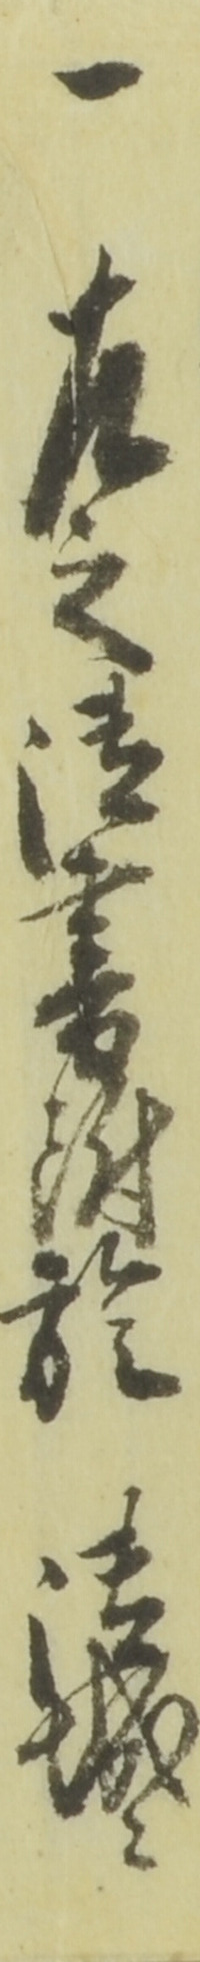一左之御書附於御城ニ
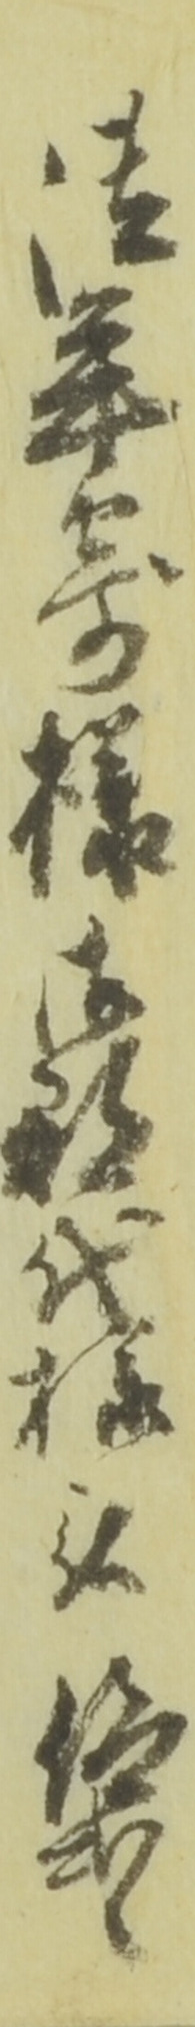御年寄様御郡代様被仰出候
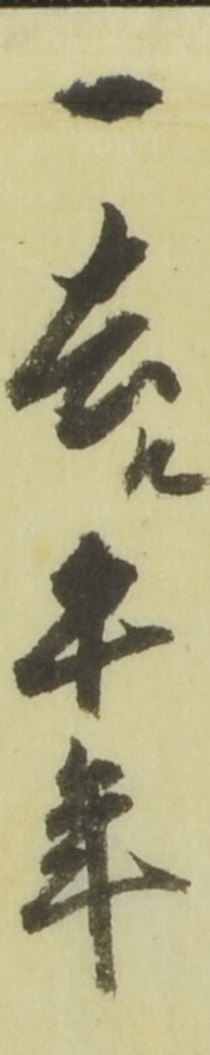一去ル午年
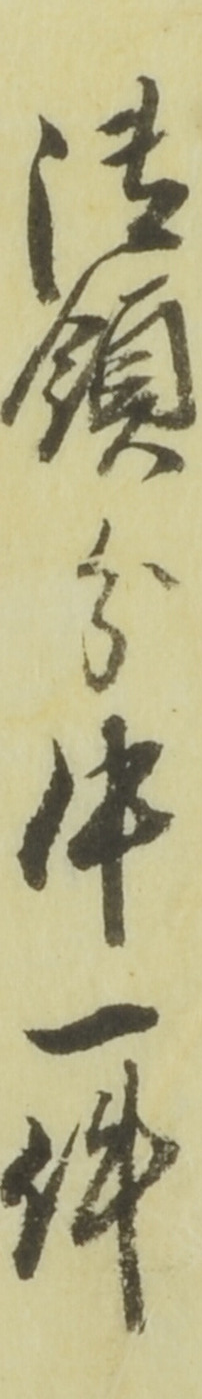御領分中一件
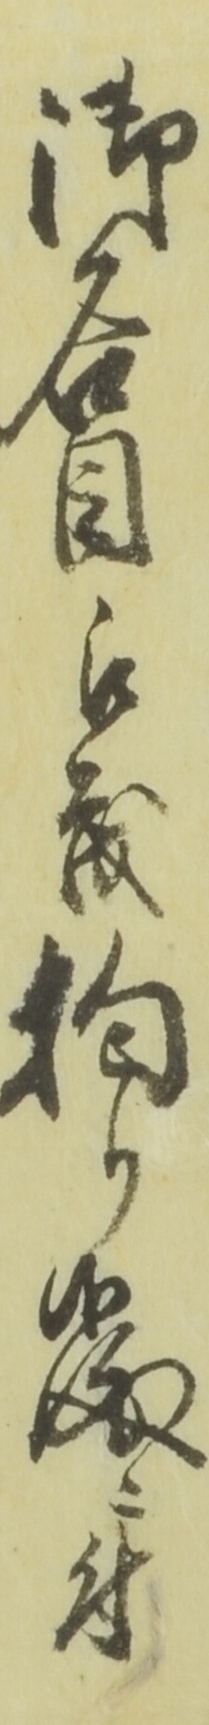御名目江も拘り候儀ニ付
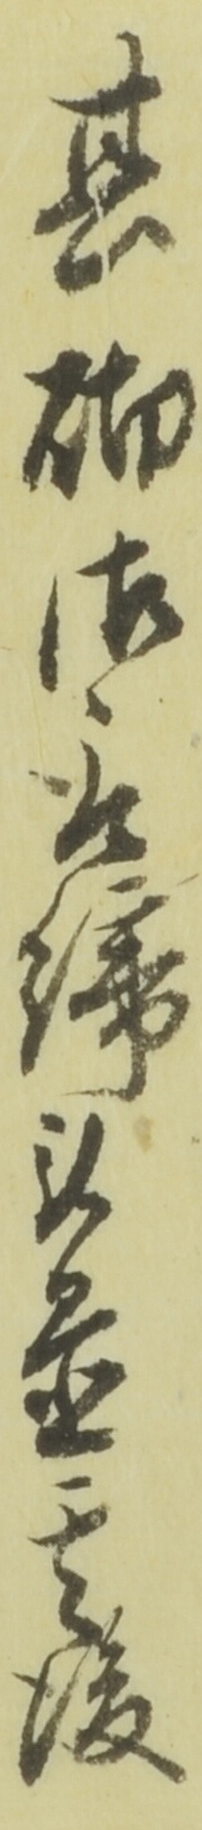其砌御取締被置其後
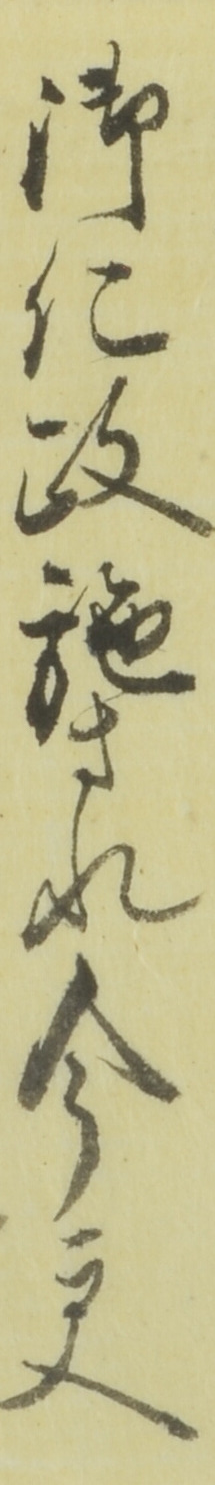御仁政施され今受
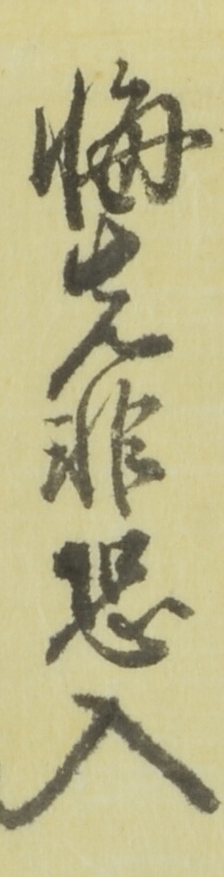悔先非恐入
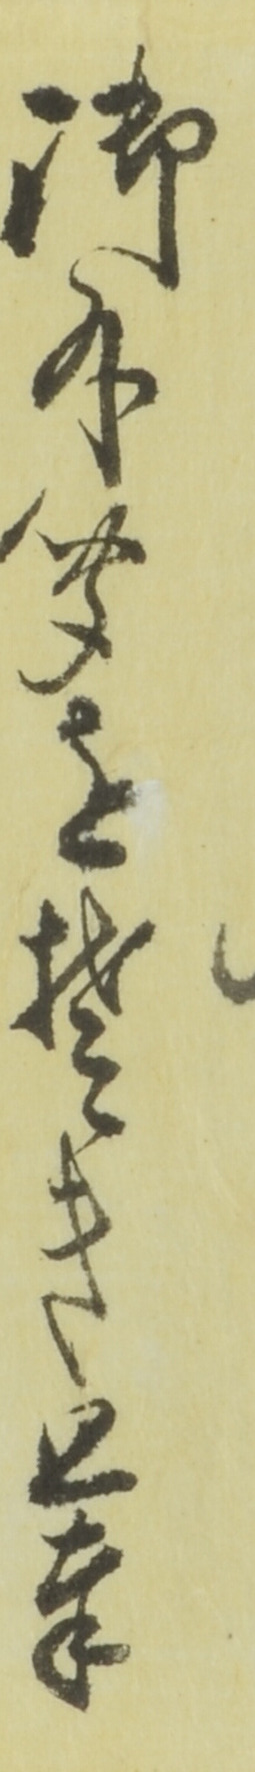御外聞をそゝき且奉
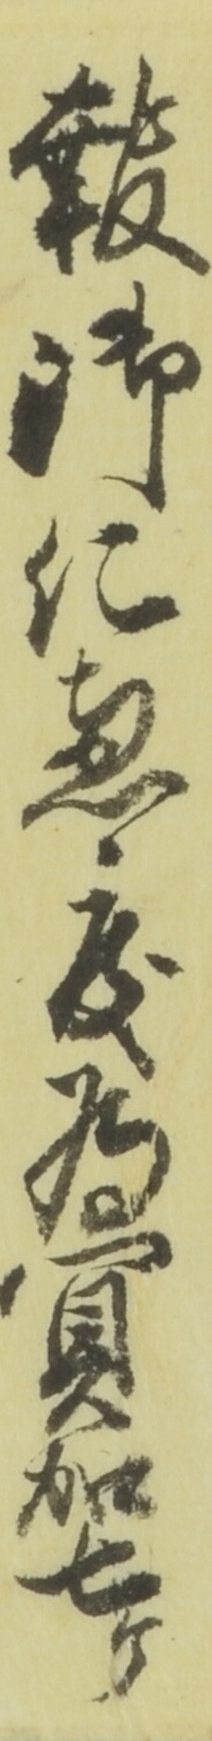報御仁恵度為冥加七ヶ
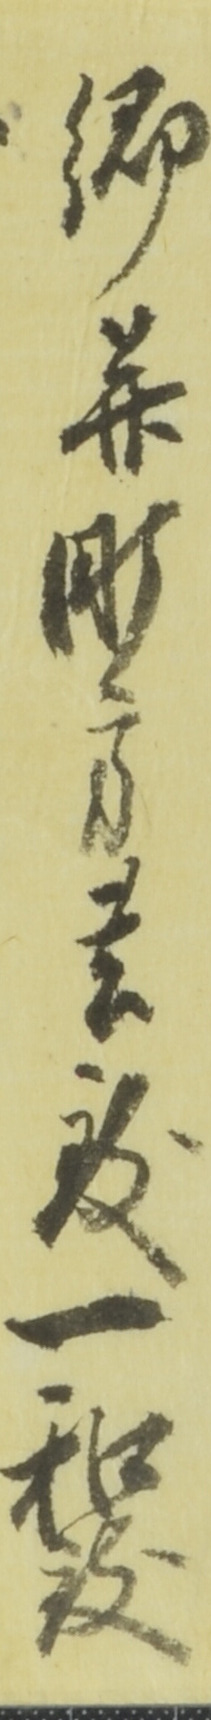郷并町方共致一和致
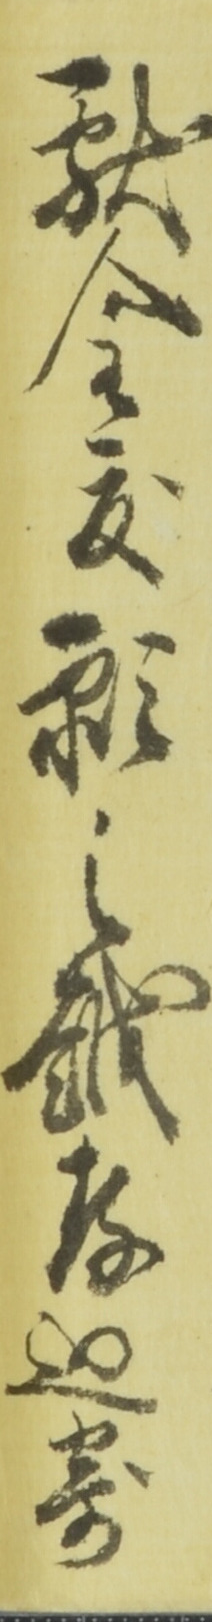献金度願之越存廻寄
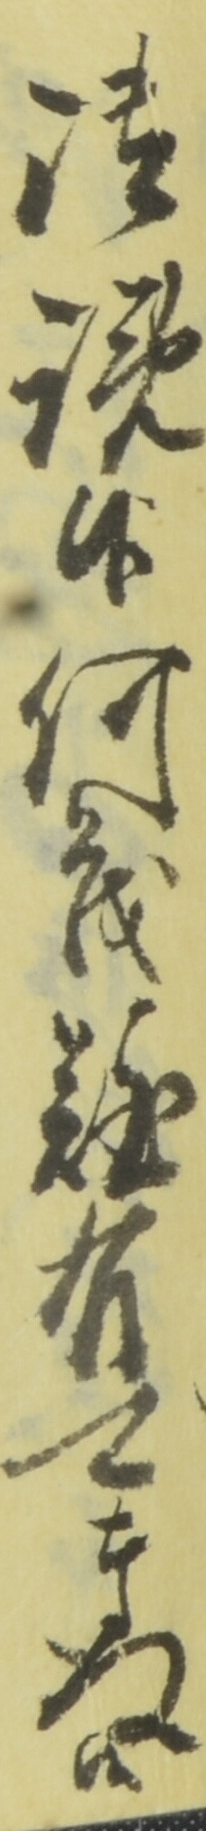御覧候何も難有可奉存候

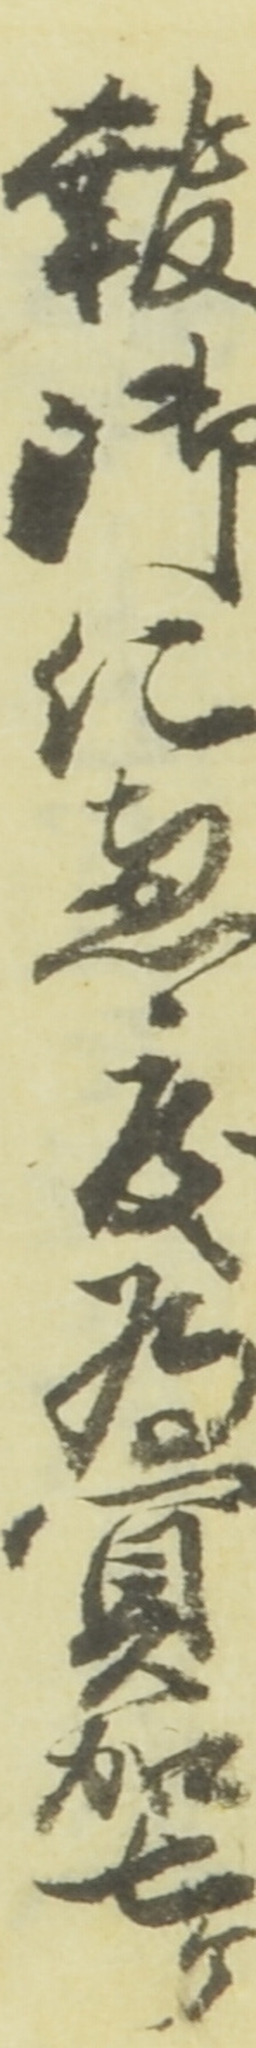報御仁恵度為冥加七ヶ
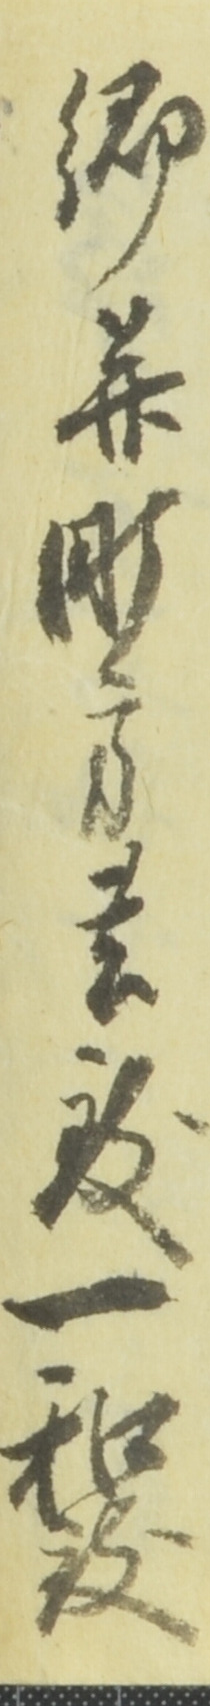郷并町方共致一和致
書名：御触書御書附控
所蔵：伊那市立高遠町図書館・合同会社AMANE
